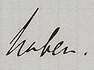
haben.
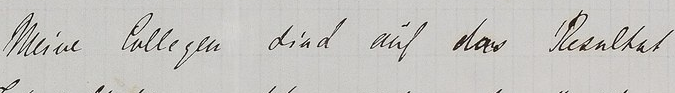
Meine Collegen sind auf das Resultat
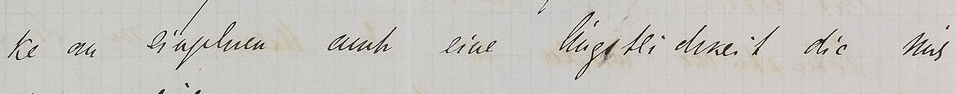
ke an einzelnen auch eine Ängstlichkeit die mir
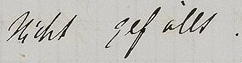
nicht gefällt.
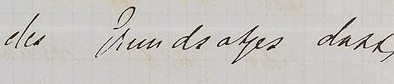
des Grundsatzes dass
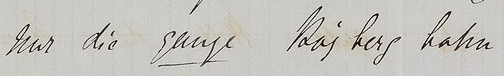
nur die ganzeBözbergbahn
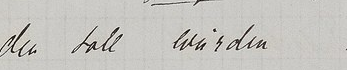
den soll wurden keine
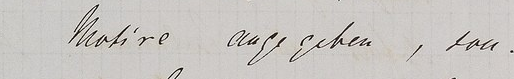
Motive angegeben, son-
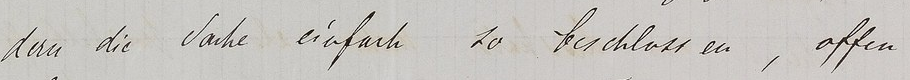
dern die Sache einfach so beschlossen, offen-
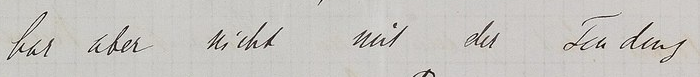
bar aber nicht mit der Tendenz dadurch
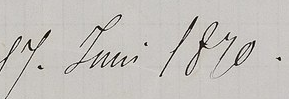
17. Juni 1870.
